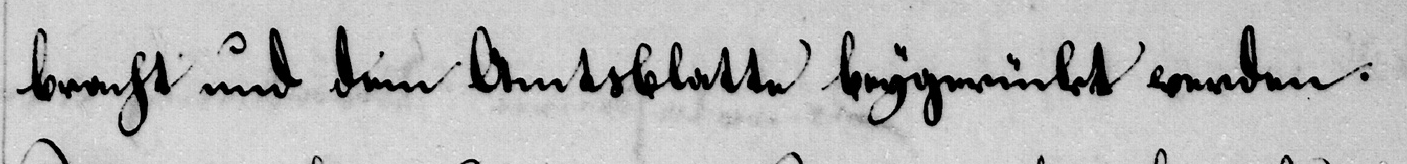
bracht und dem Amtsblatte beygerückt werden.
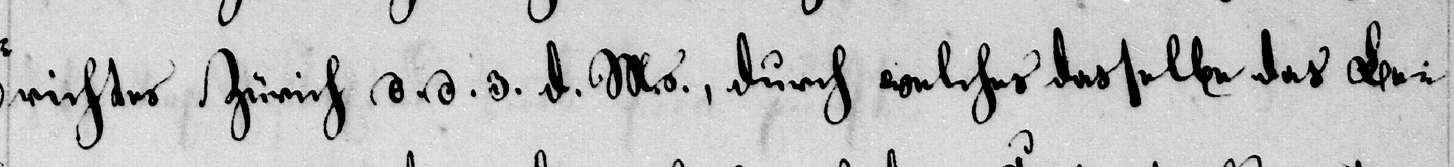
richtes Zürich d. d. 3. d. Ms., durch welches dasselbe das Be¬
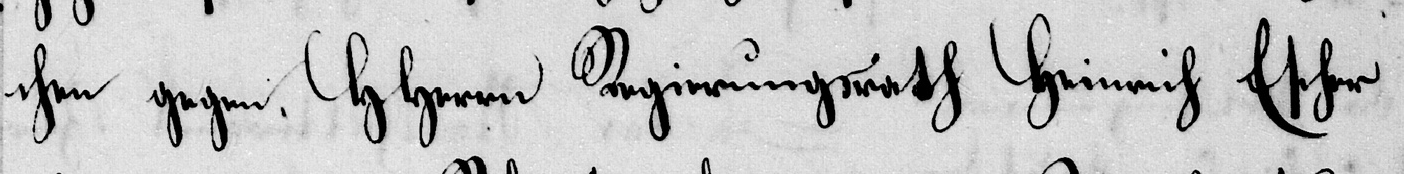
che gegen HHerrn Regierungsrath Heinrich Escher
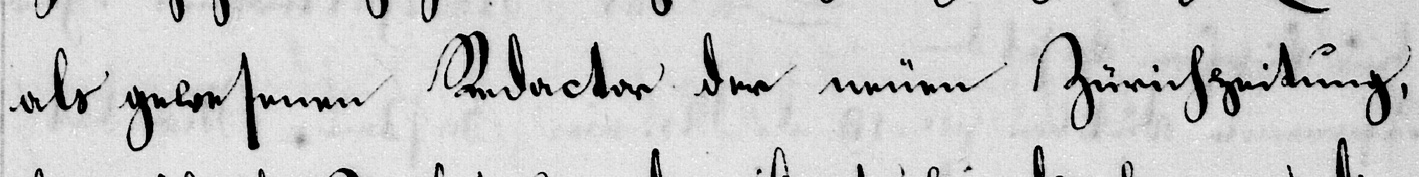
als gewesenen Redactor der neuen Zürichzeitung,
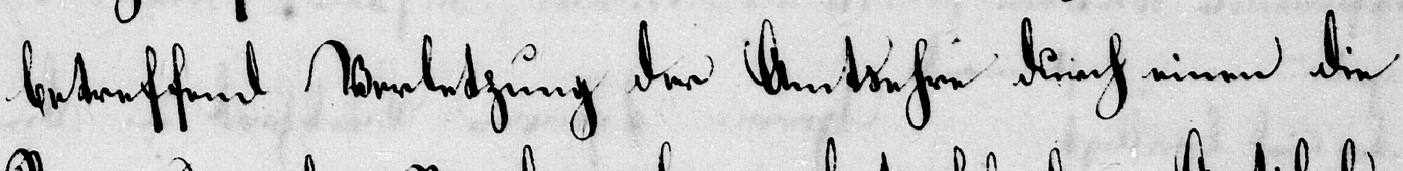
betreffend Verletzung der Amtsehre durch einen die
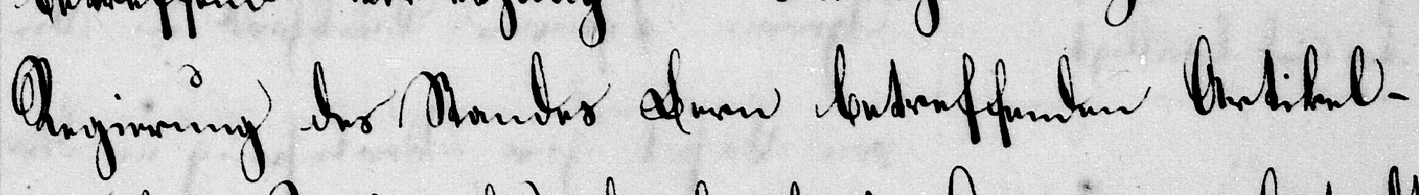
Regierung des Standes Bern betreffenden Artikel
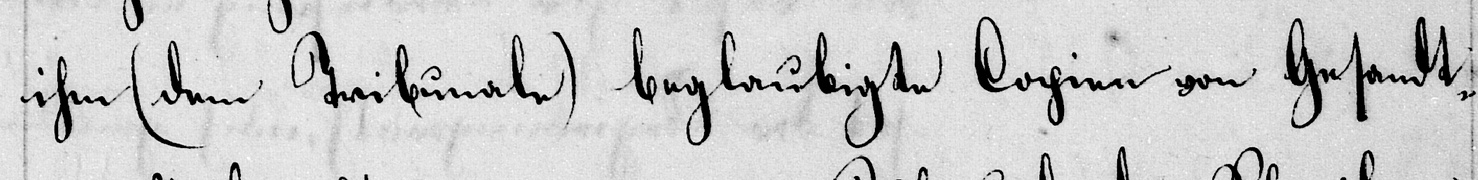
ihm (dem Tribunale) beglaubigte Copien von Gesandt¬
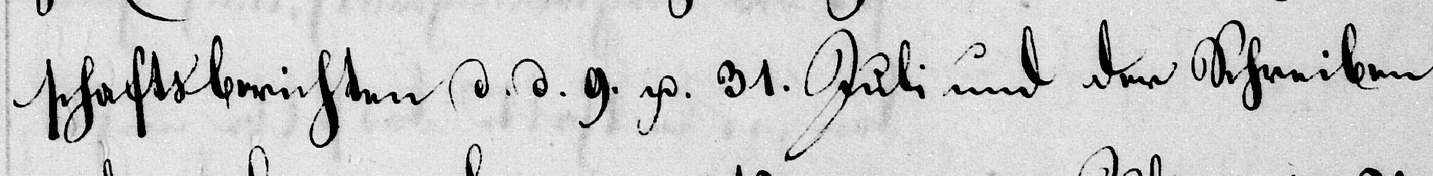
schaftsberichten d. d. 9. u. 31. Juli und der Schreiben
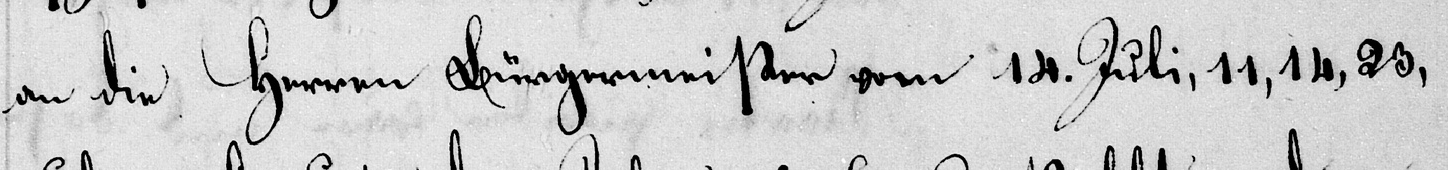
an die Herren Bürgermeister vom 14. Juli, 11, 14, 23,
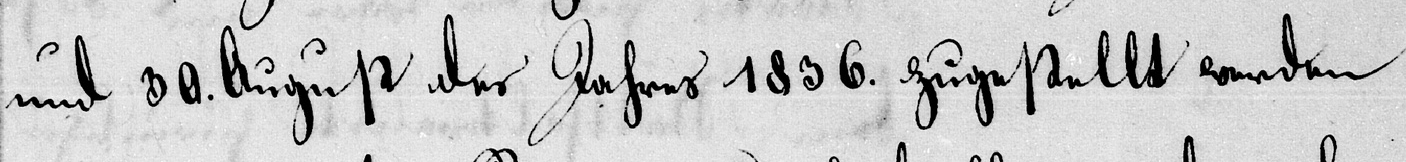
und 30. August des Jahres 1836. zugestellt werden
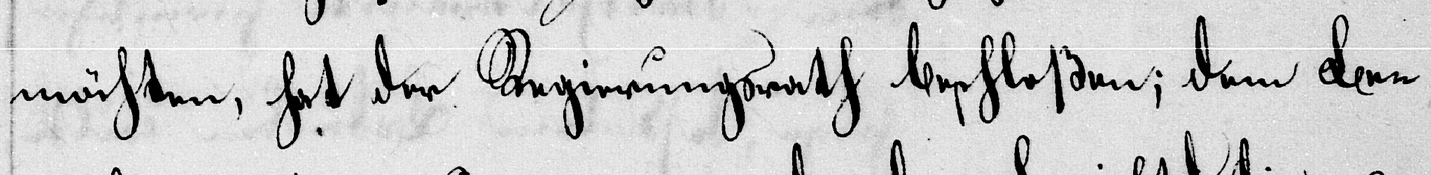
möchten, hat der Regierungsrath beschloßen; dem Be¬
